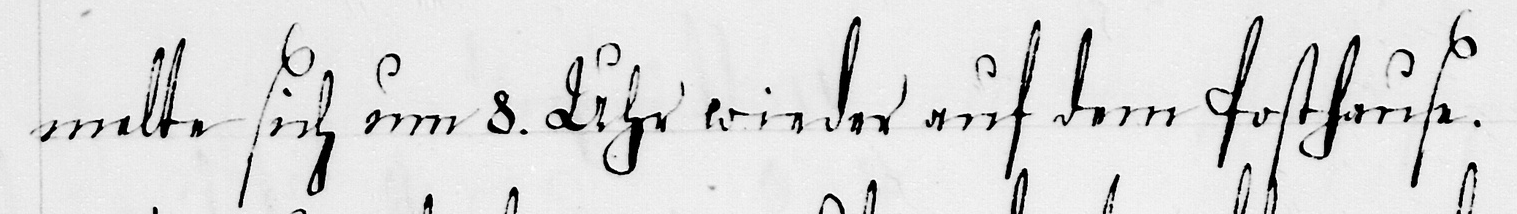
melte sich um 8. Uhr wieder auf dem Posthause.
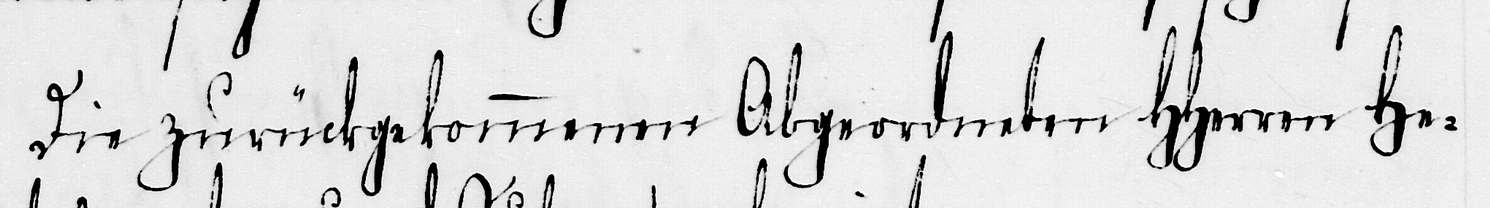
Die zurückgekommenen Abgeordneten HHerren He¬
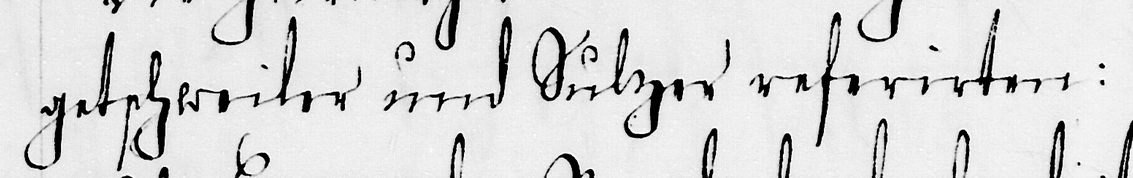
getschweiler und Sulzer referirten:
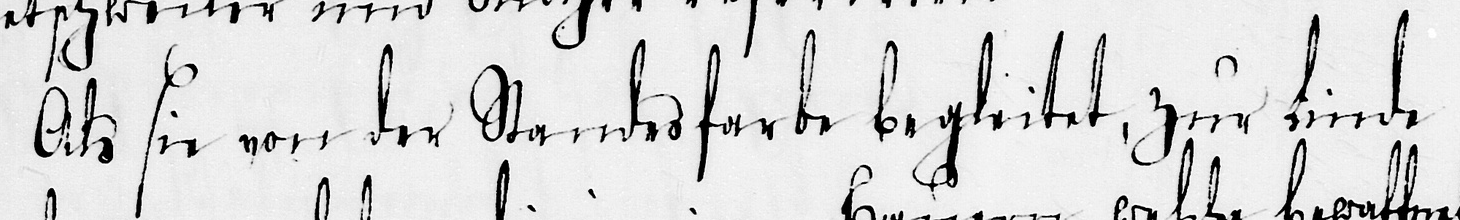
Als sie von der Standesfarbe begleitet, zur Linde
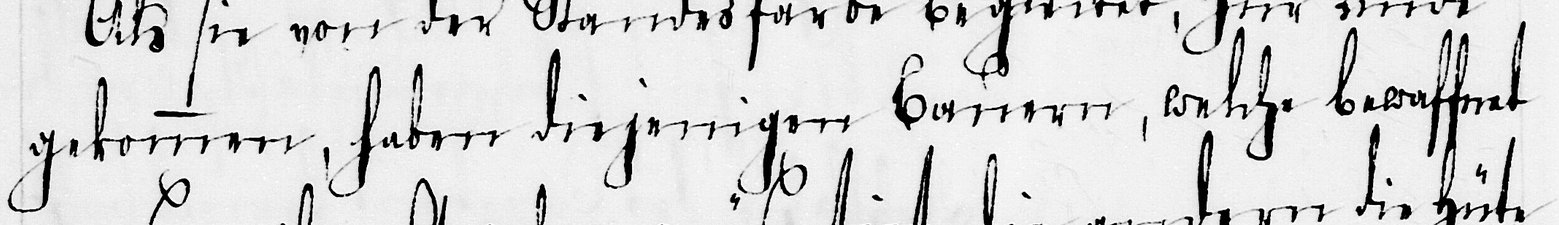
gekommen, haben diejenigen Bauern, welche bewaffnet
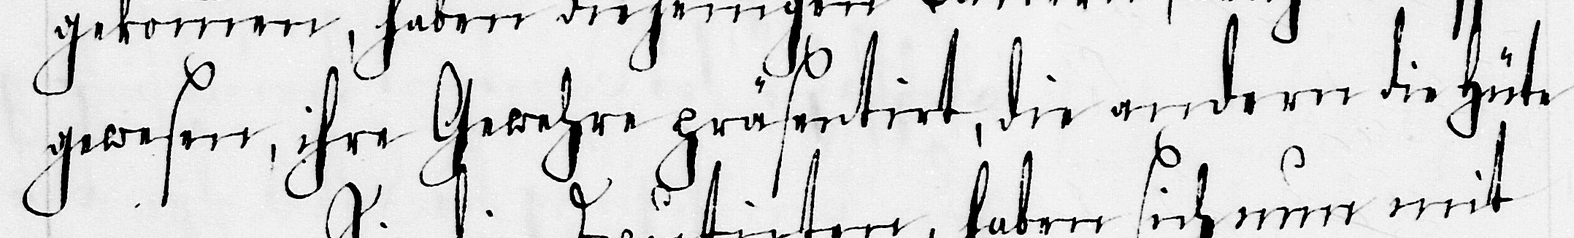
gewesen, ihre Gewehre präsentirt, die andern die Hüte
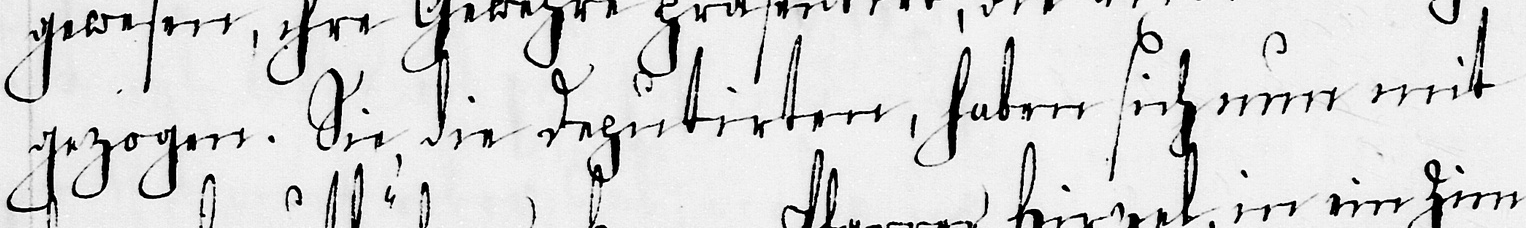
gezogen. Sie, die Deputirten, haben sich nun mit
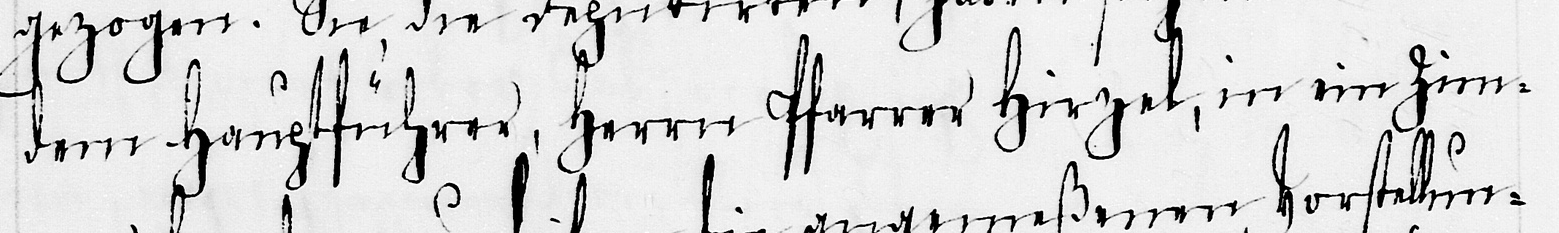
dem Hauptführer, Herrn Pfarrer Hirzel, in ein Zim¬
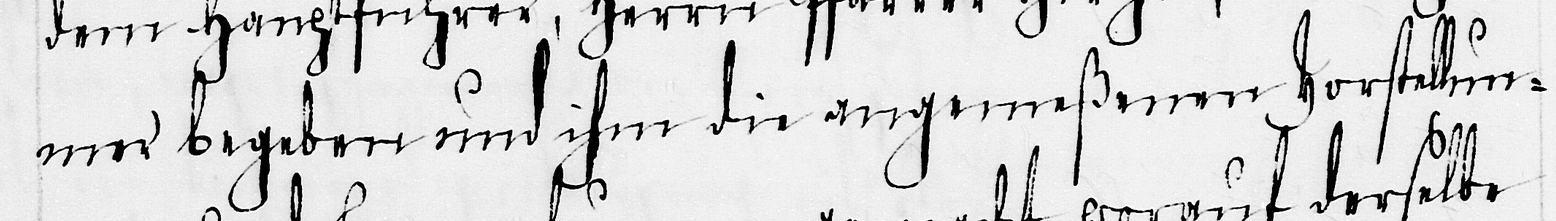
mer begeben und ihm die angemeßenen Vorstellun¬
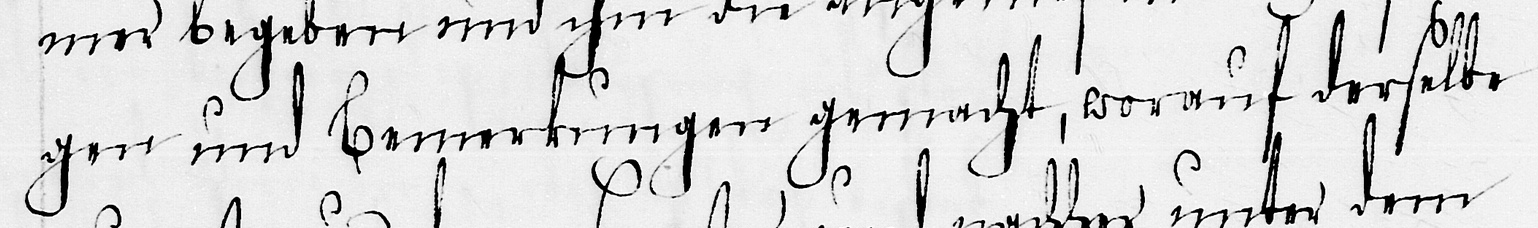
gen und Bemerkungen gemacht, worauf derselbe
